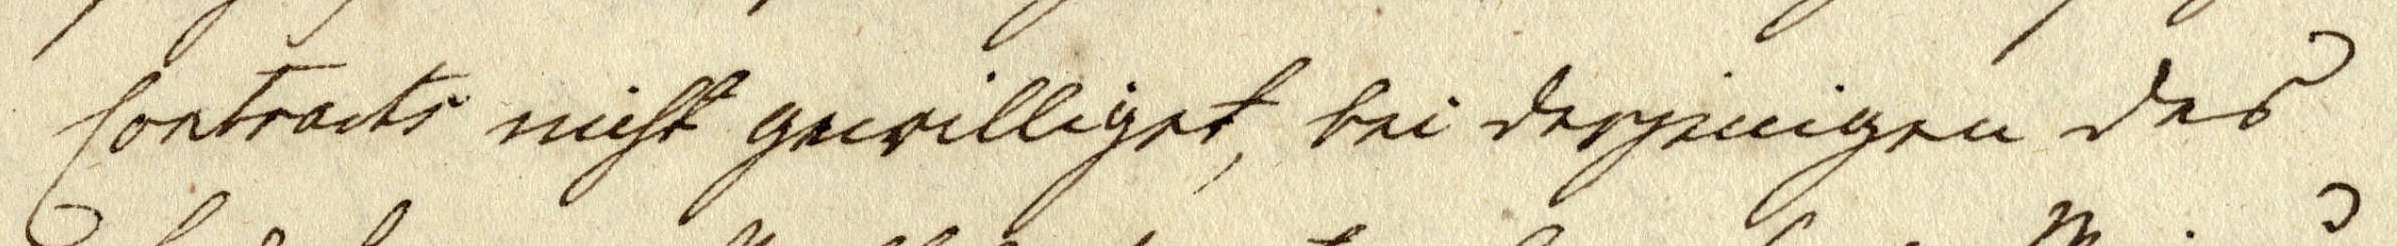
Contracts nicht gewilliget, bei derjenigen des
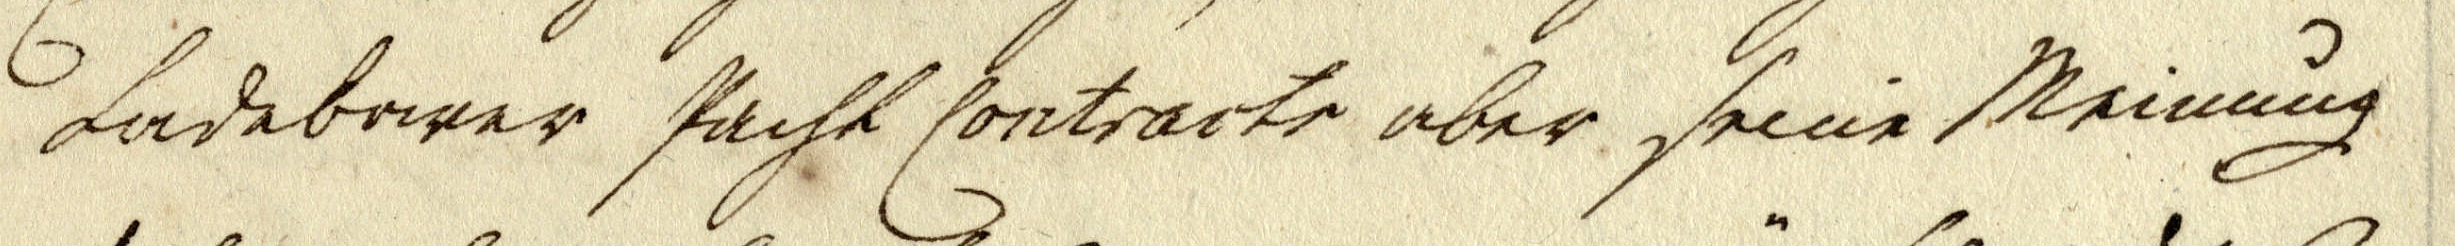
Ladebower Pacht Contracts aber seine Meinung
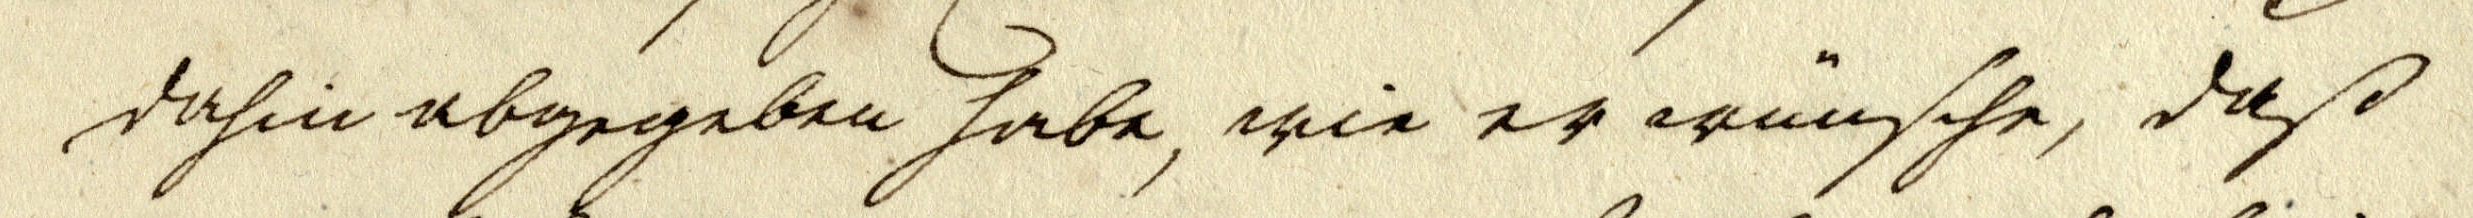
dahin abgegeben habe, wie er wünsche, daß
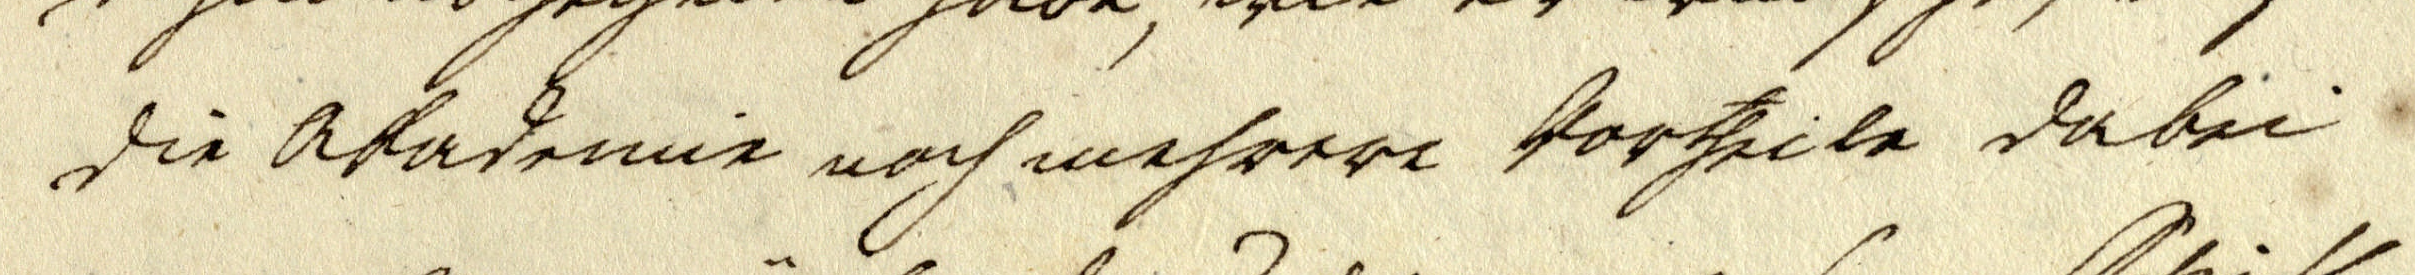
die Akademie noch mehrere Vortheile dabei
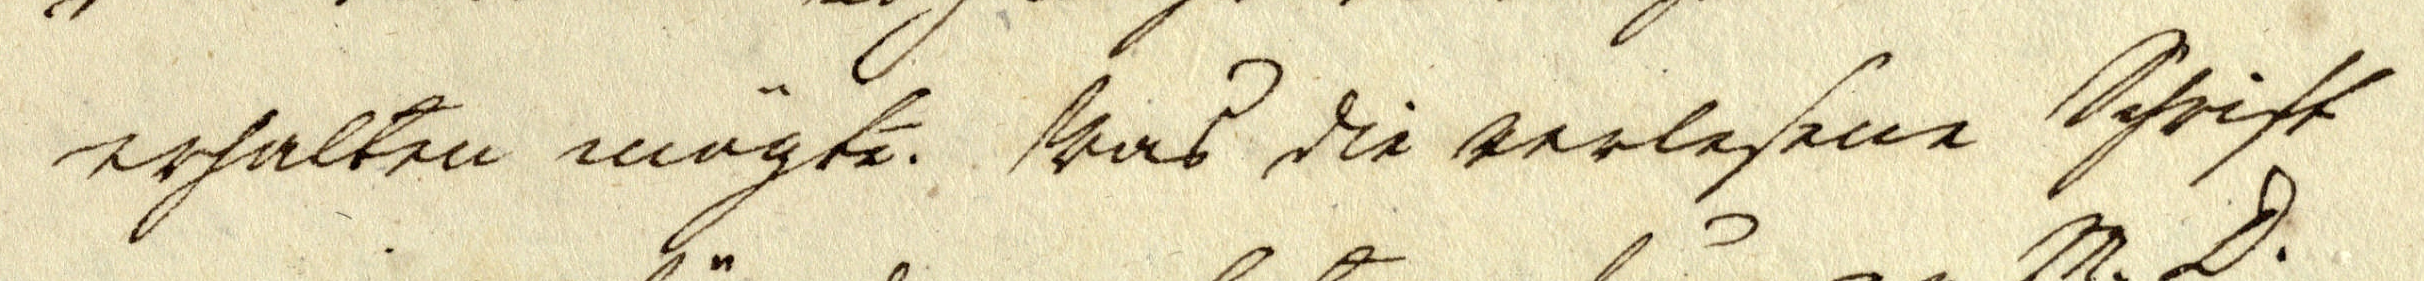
erhalten mögte. Was die verlesene Schrift
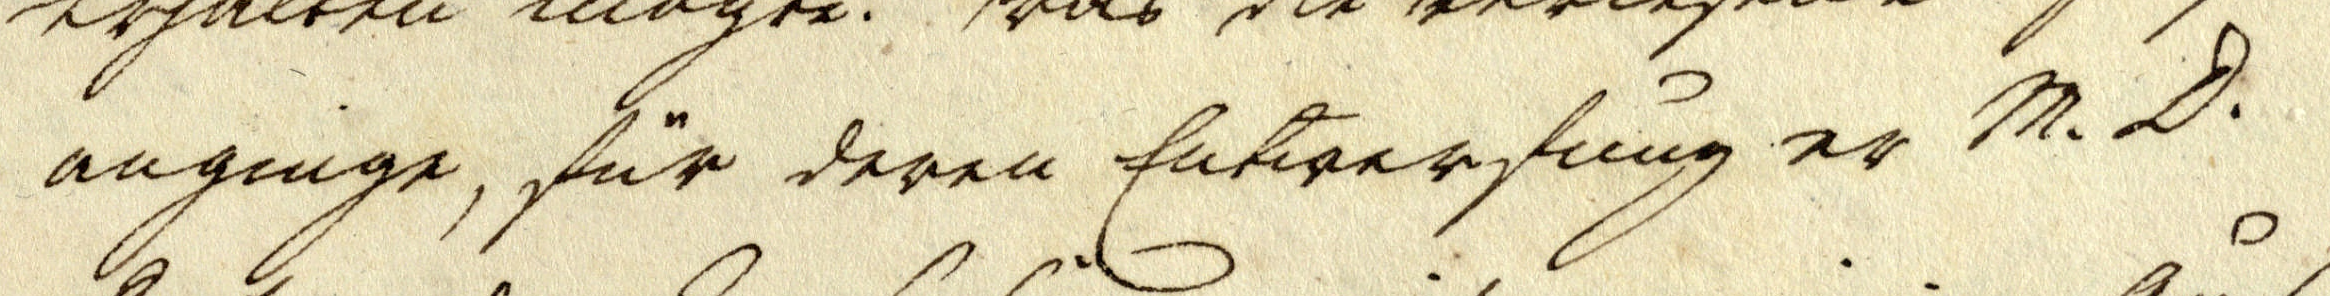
anginge, für deren Entwerfung er M. D.
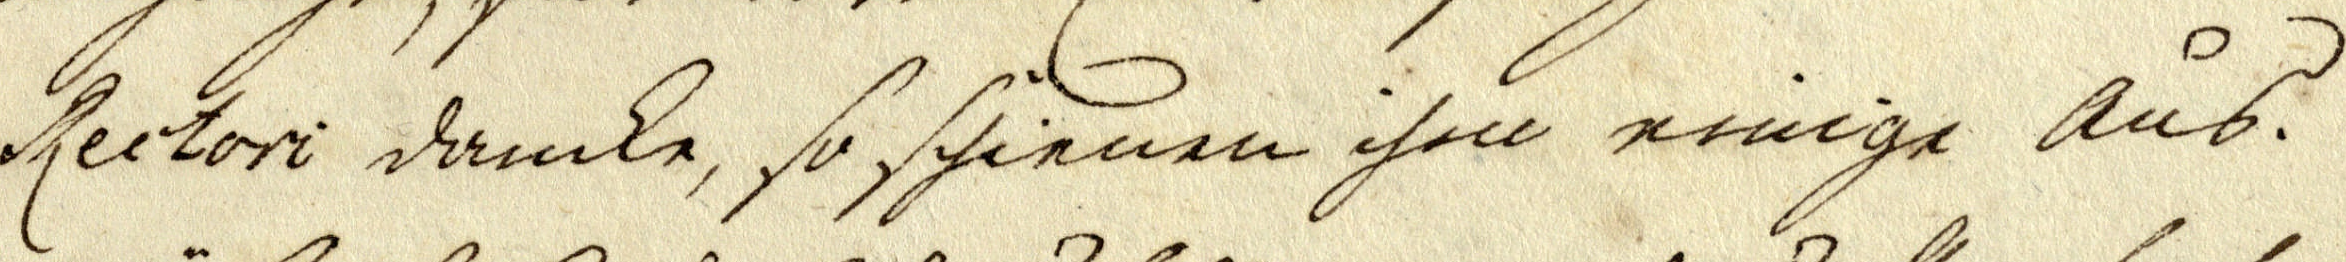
Rectori dancke, so schienen ihm einige Aus¬
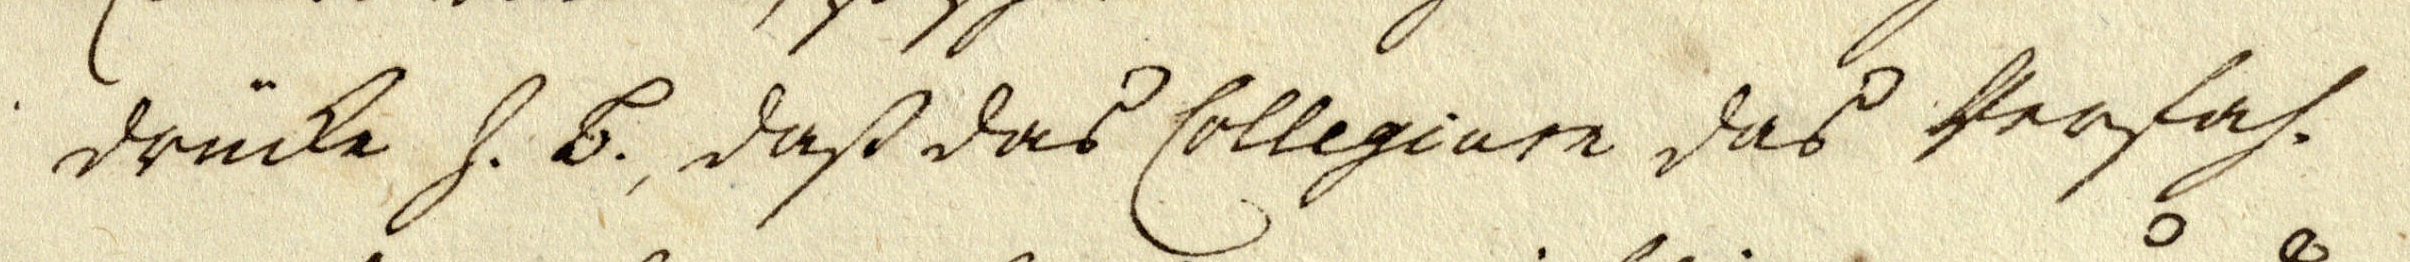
drücke z. B., daß das Collegium das Verfah¬
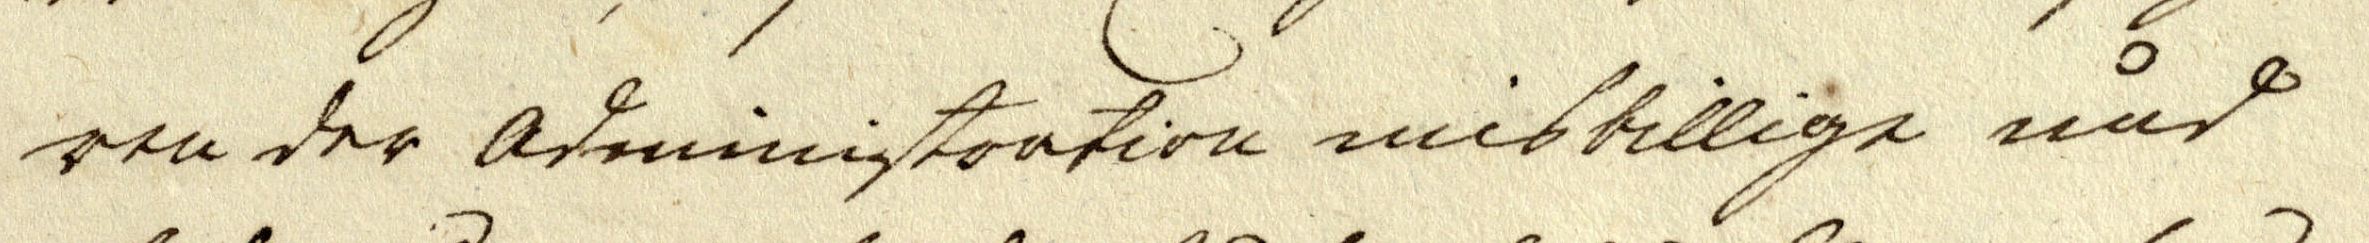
ren der Administration misbillige und
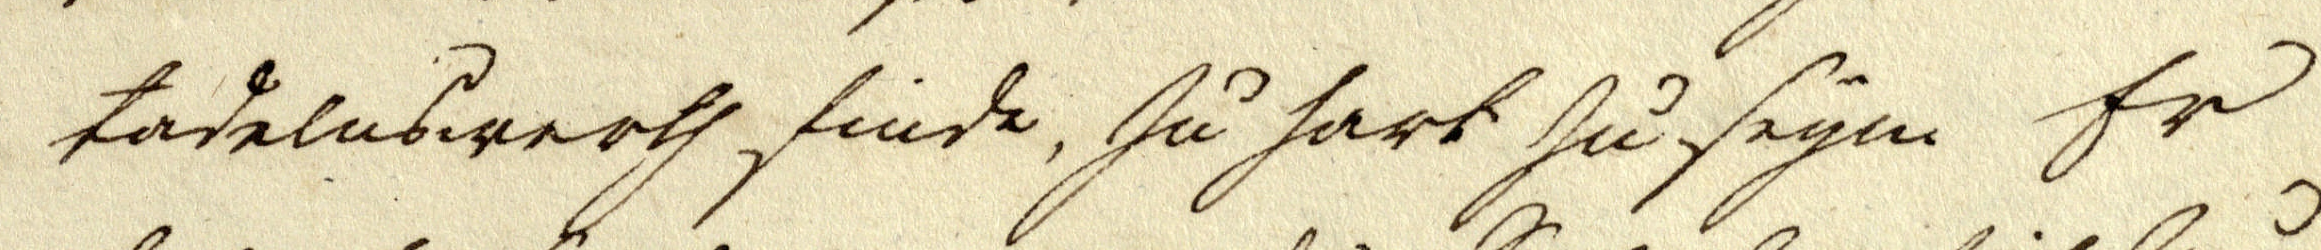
tadelnswerth finde, zu hart zu seÿen. Er
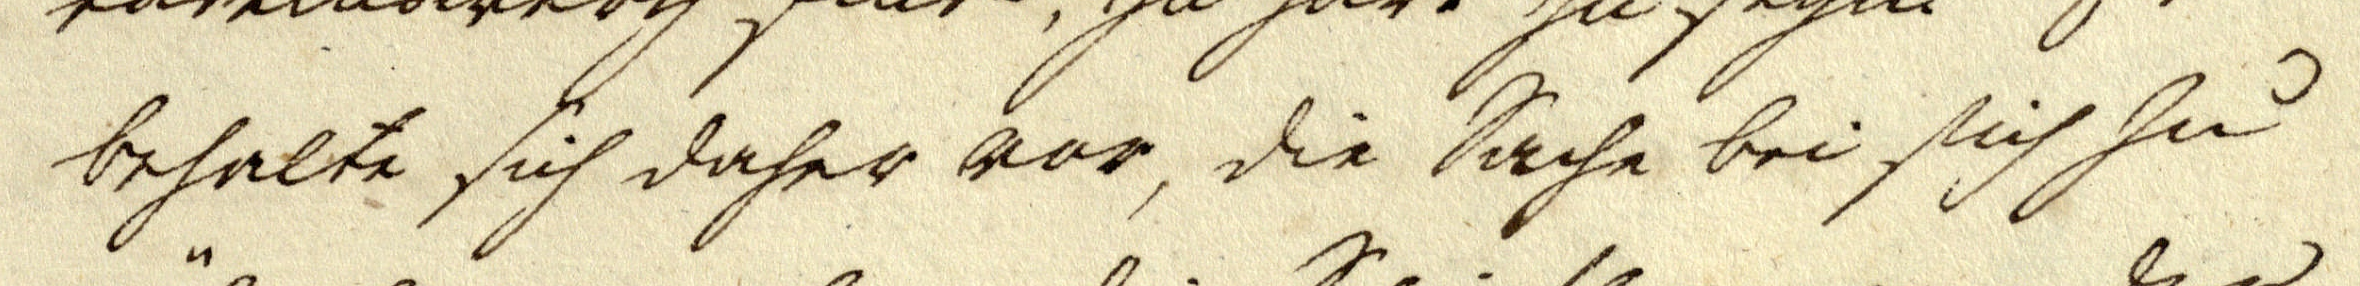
behalte sich daher vor, die Sache bei sich zu
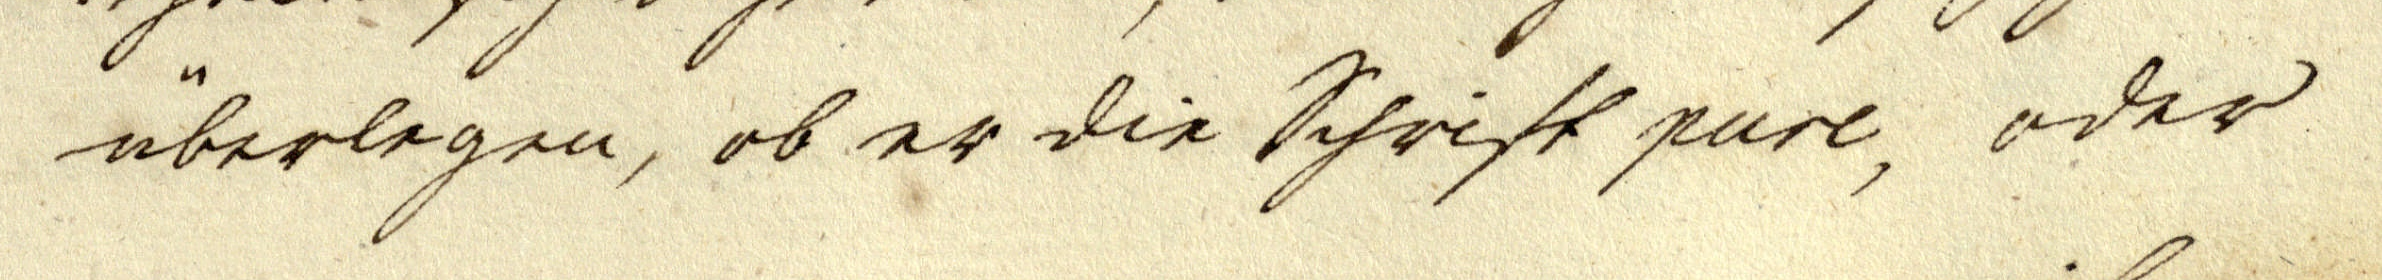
überlegen, ob er die Schrift pure, oder
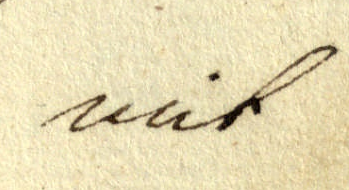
mit
